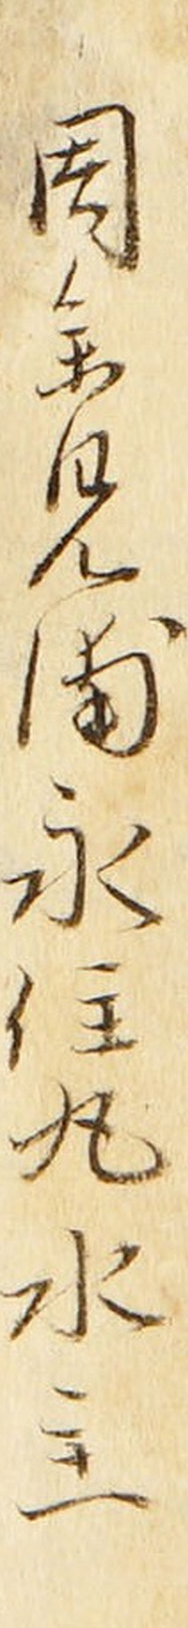周余見浦永住丸水主
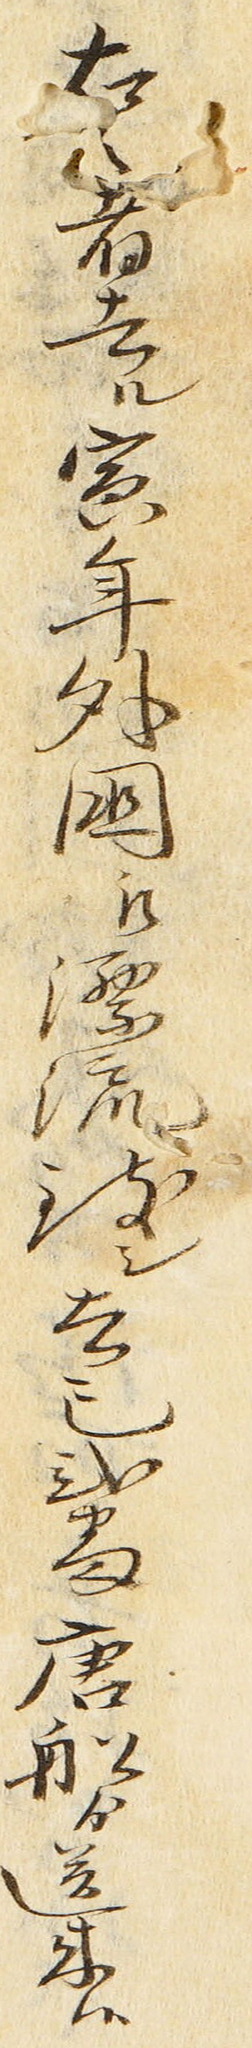右之者去る寅年外国江漂流致し去巳弐冨唐船ゟ送来候
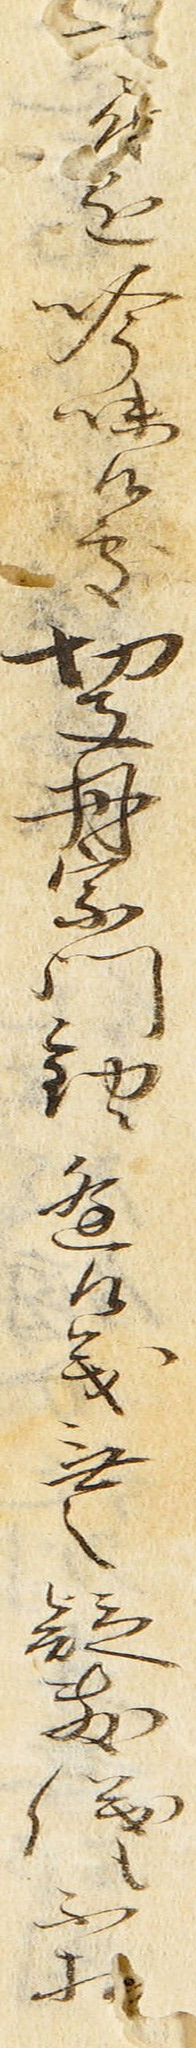に付を吟味候處切支丹宗門勧進候義無之疑敷儀も不持
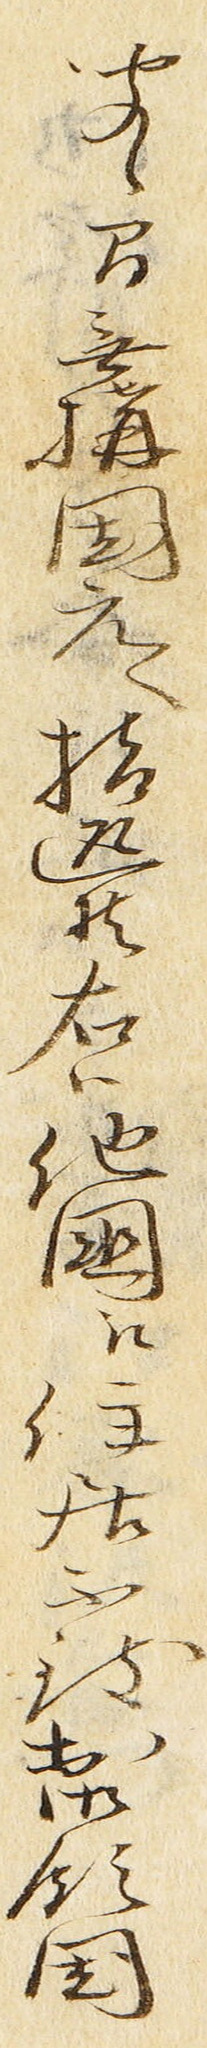聞候間無構国元へ指返候右は他国江住居不致於御領国
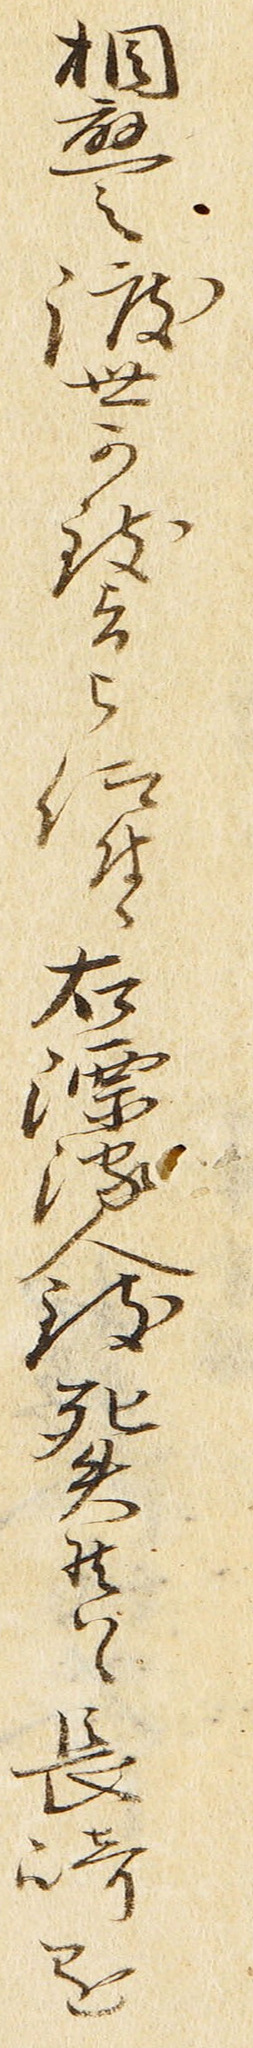相応之渡世可致旨被仰付候右漂流人致し死失候はは長崎を
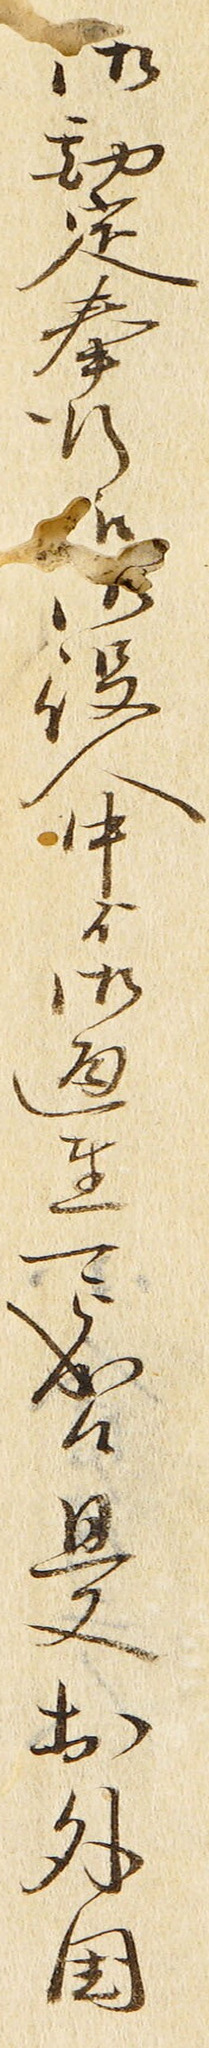御勘定奉行江御役人中ゟ御通連可被成候且又於外国
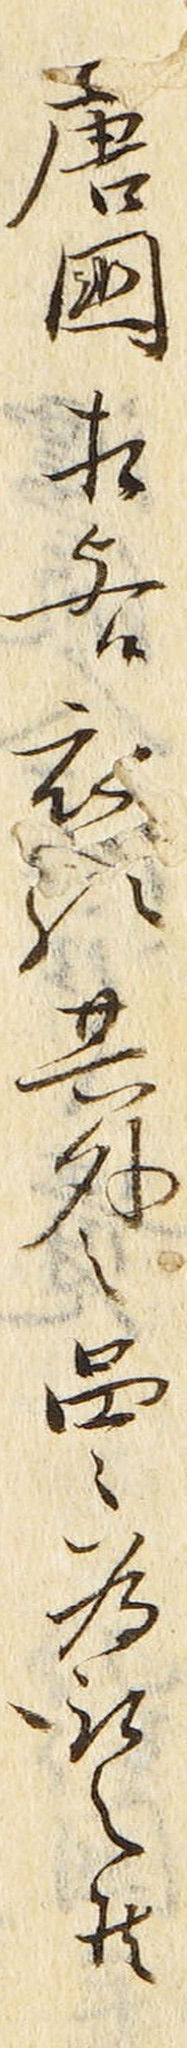唐国相与候衣類其外之品々為取之候
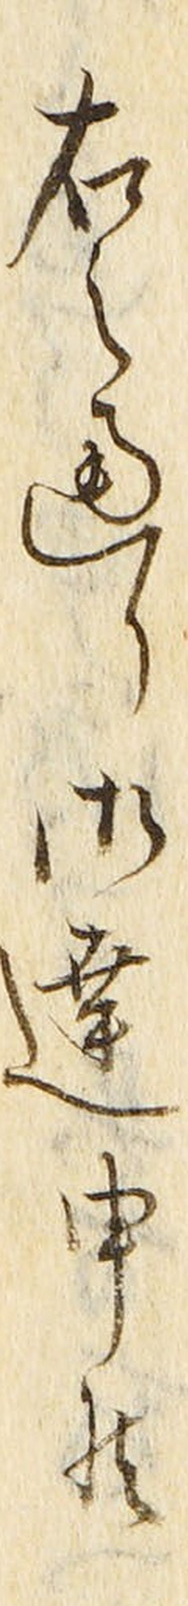右之通り御達申候
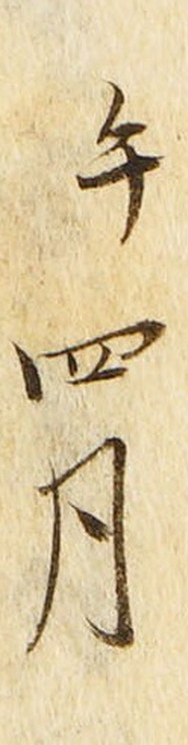午四月
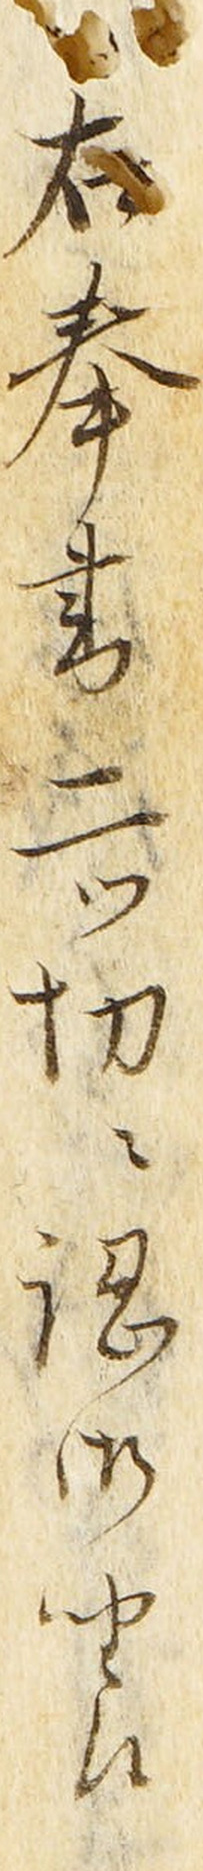右奉書二ツ切に認御座候
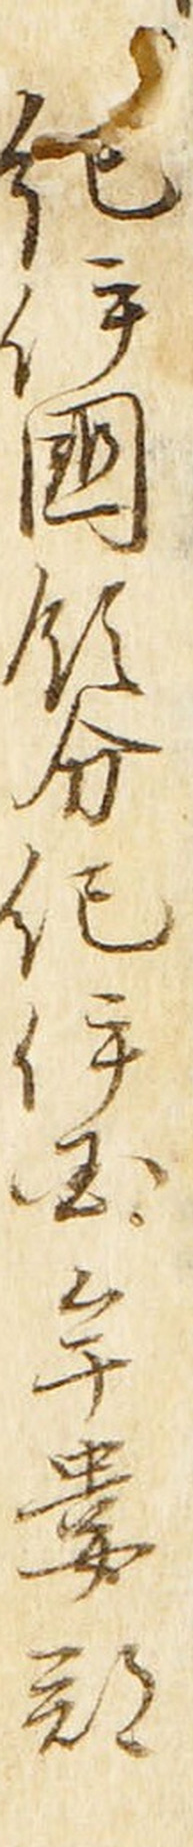紀伊国領分紀伊国牟婁郡
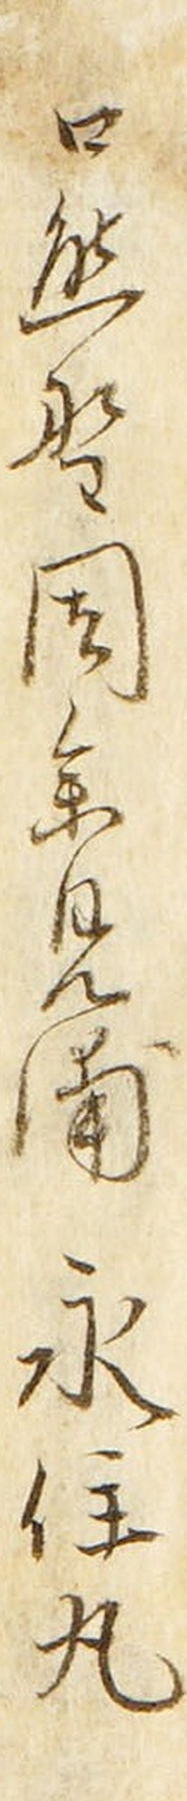口然習周余見浦永住丸
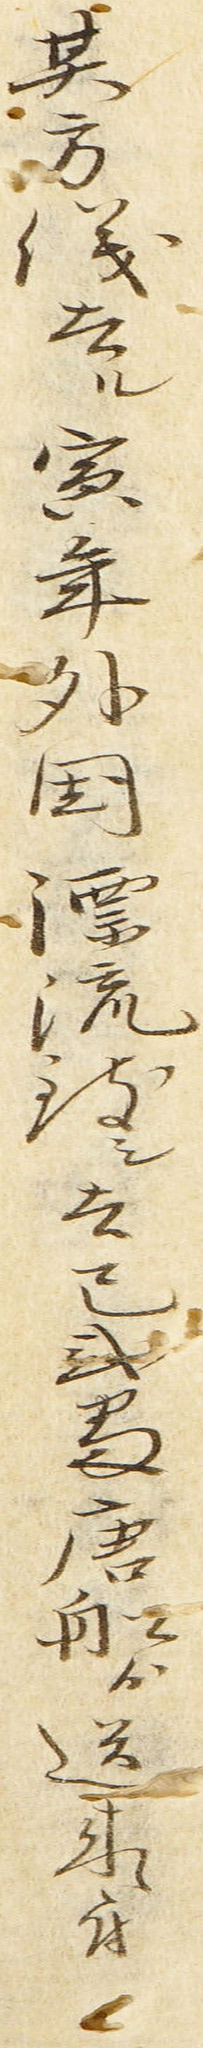其方儀去る寅年外国漂流致し去巳弐？唐船ゟ送来候に付

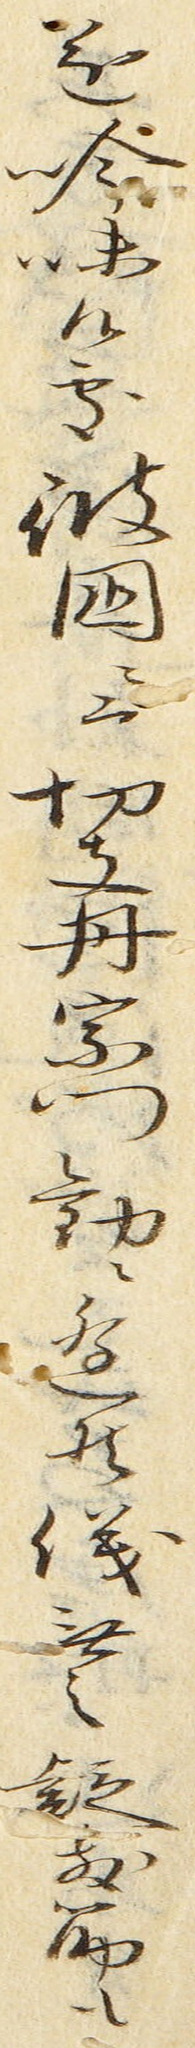を吟味候處彼国に而切支丹宗門勧に進候儀無之疑敷筋も
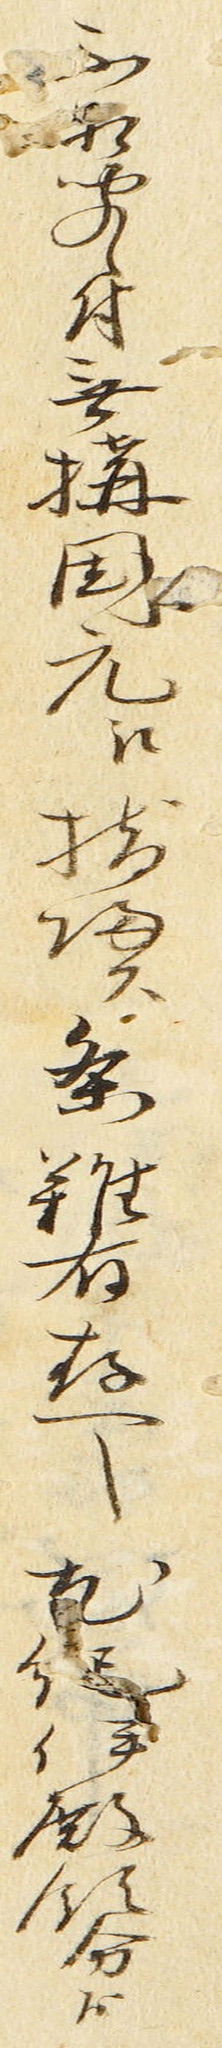不相聞候付無構国元江指帰す条難有存へし尤紀伊殿領分ゟ
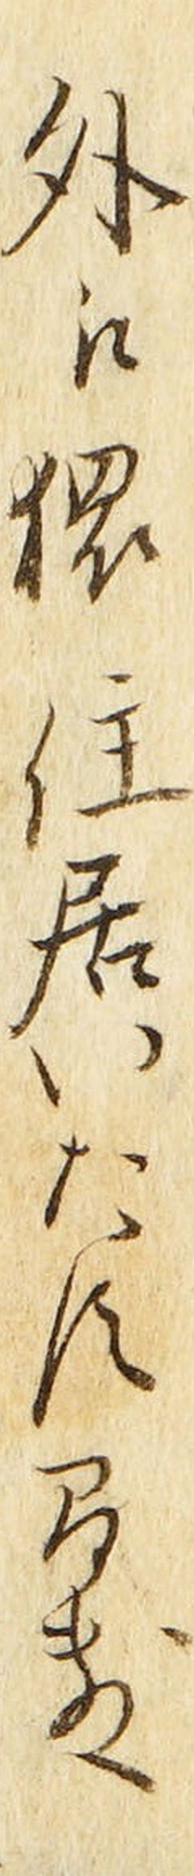外江猶住居いたす間敷候
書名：漂流人弥市之記
